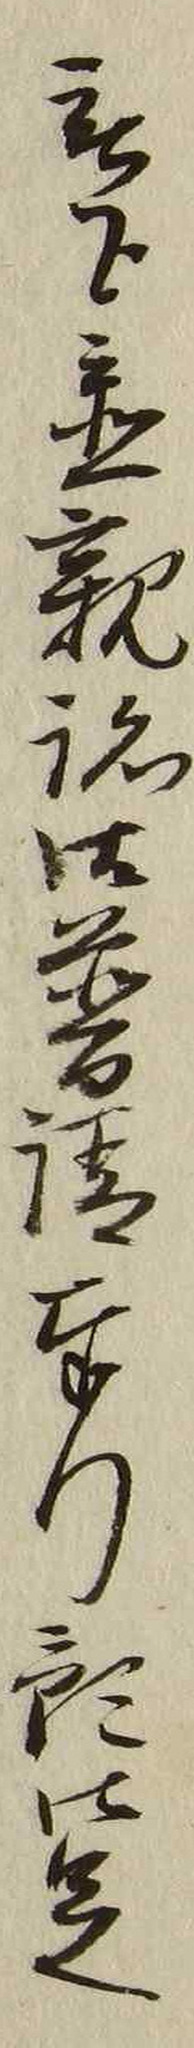被下置親跡御普請奉行預御足
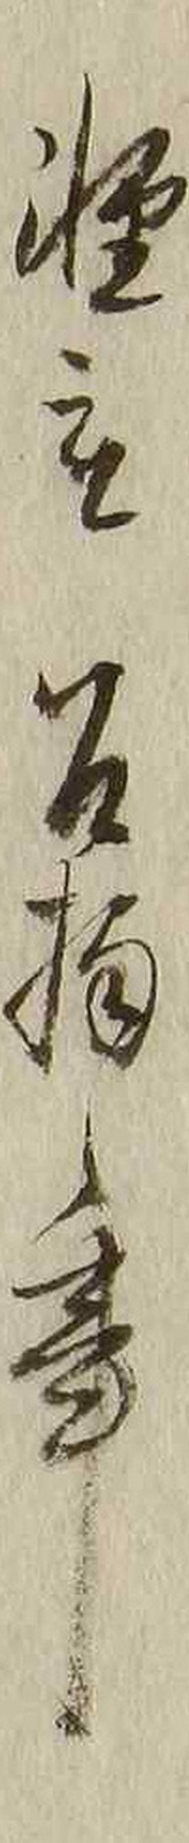軽被召抱候事
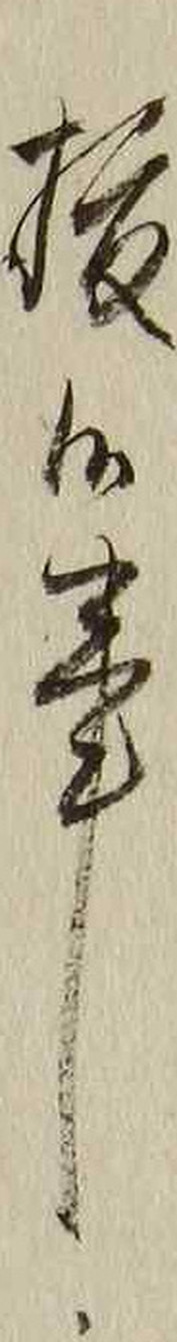抜候事
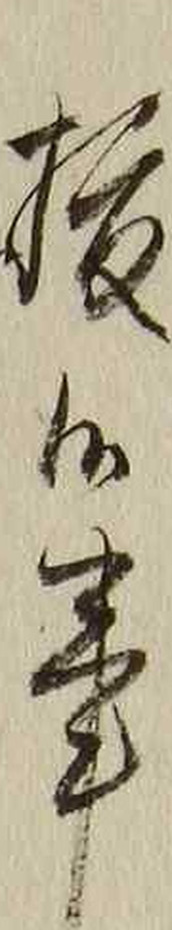抜候事
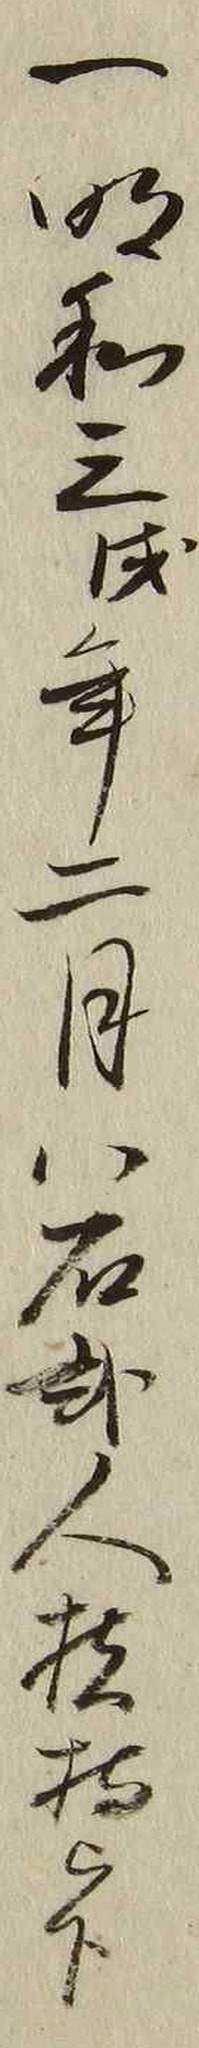一明和三戌年二月八石弐人扶持被下
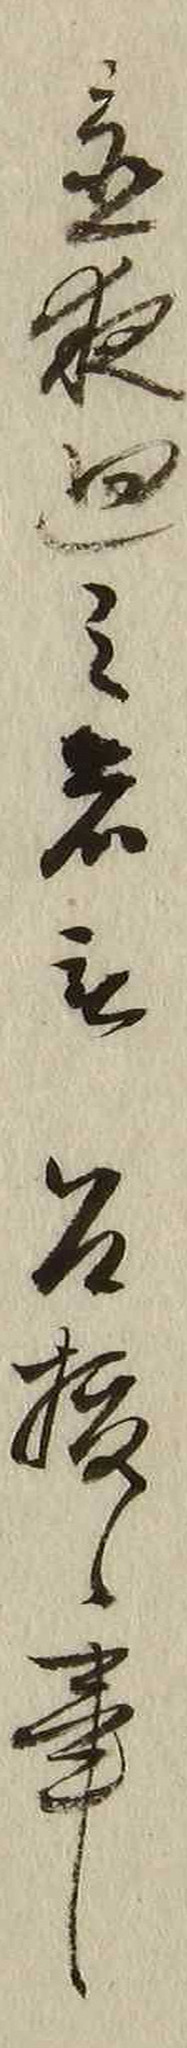置夜廻之者被召抜候事
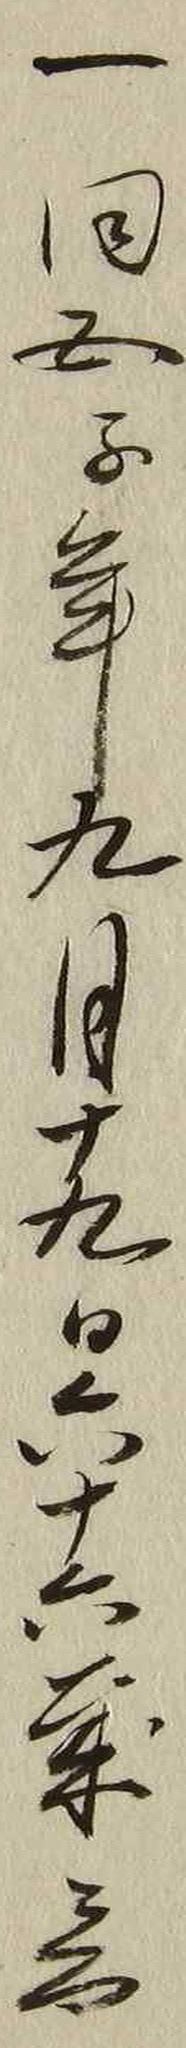一同五子年九月十九日六十六歳ニ而
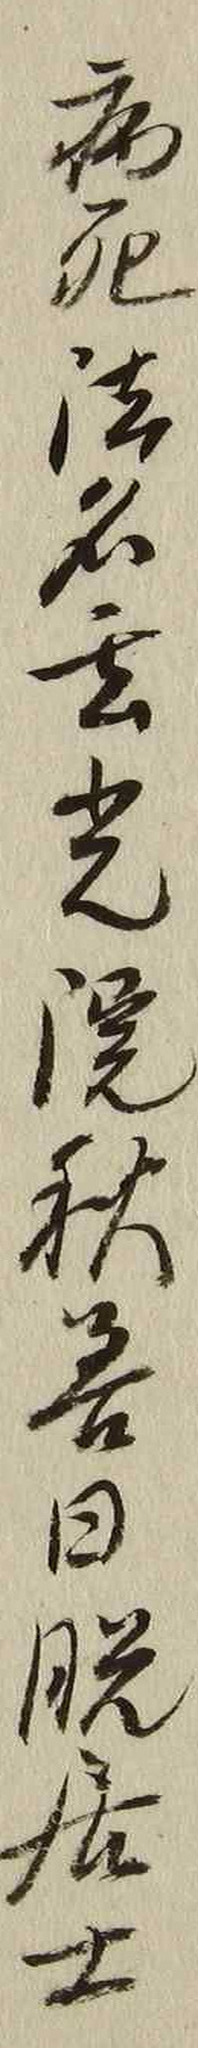病死法名玄光院秋善日脱居士
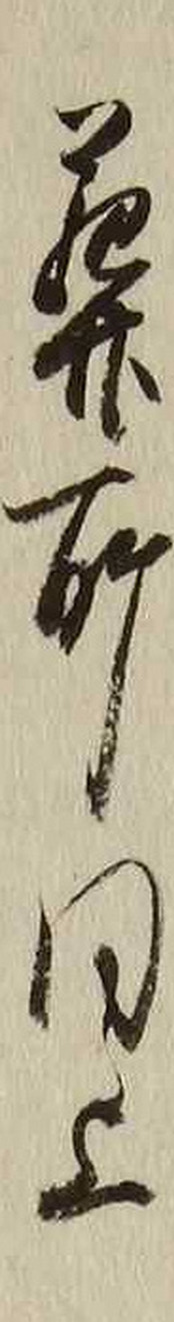葬所同上
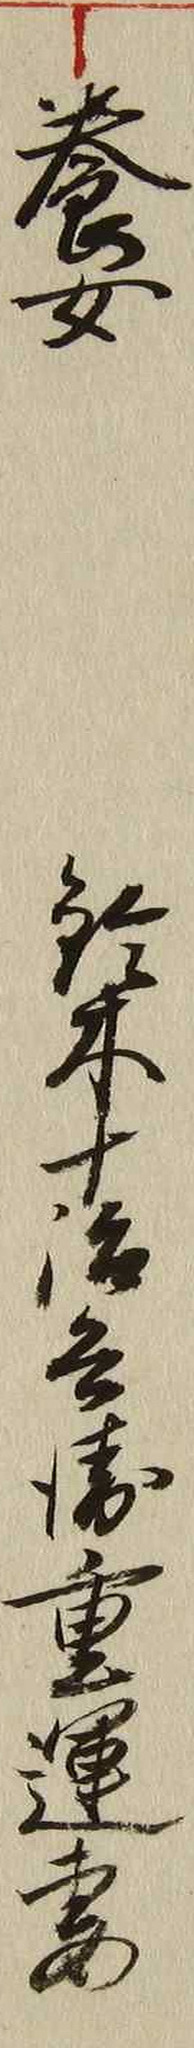養女鈴木十治兵衛重運妻
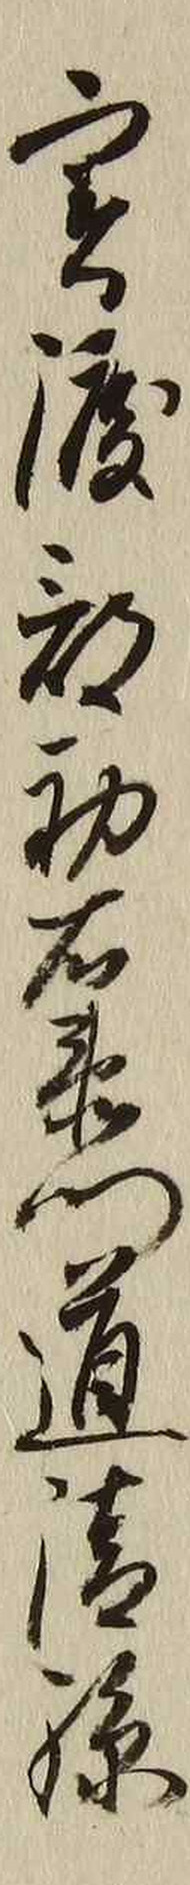実渡部初右衛門道清孫
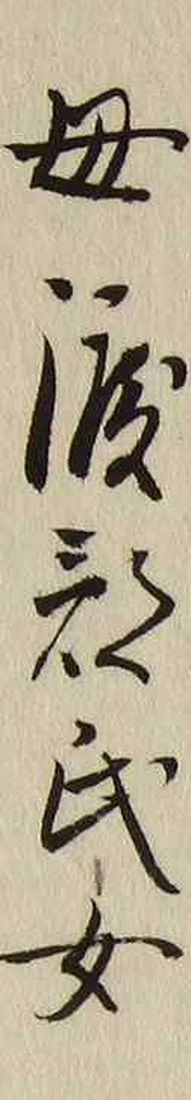母渡部氏女
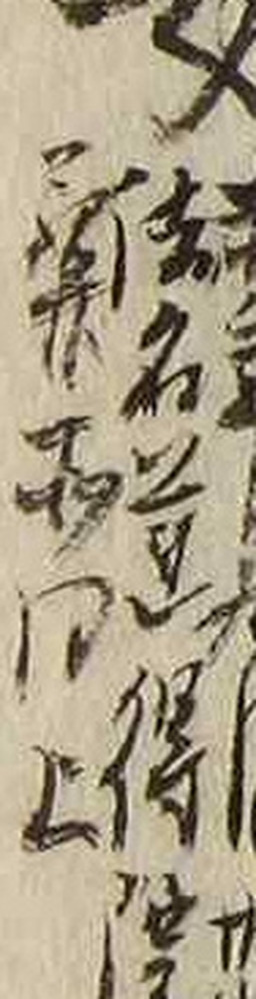葬所同上

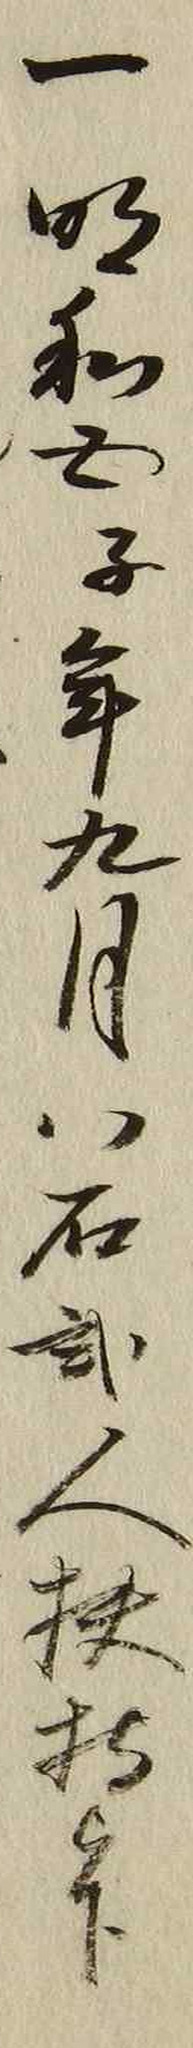一明和五子年九月八石弐人扶持被下
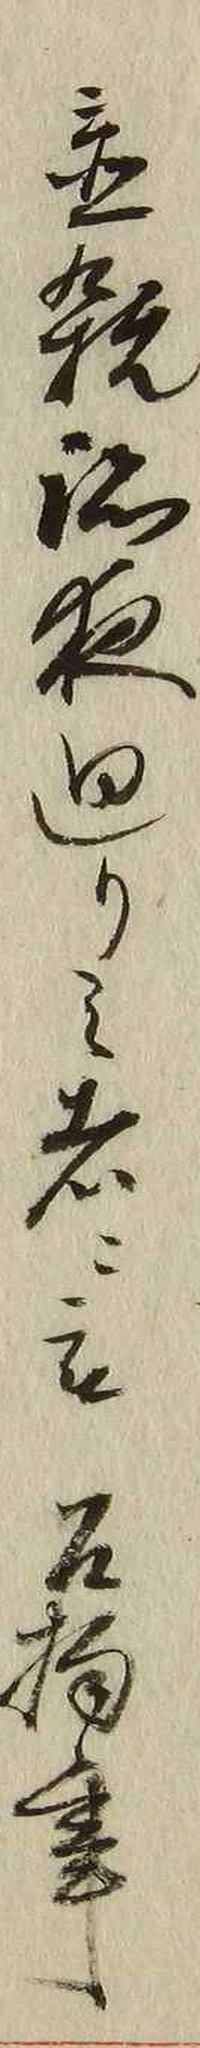置親跡夜廻り之者ニ被召抱候事
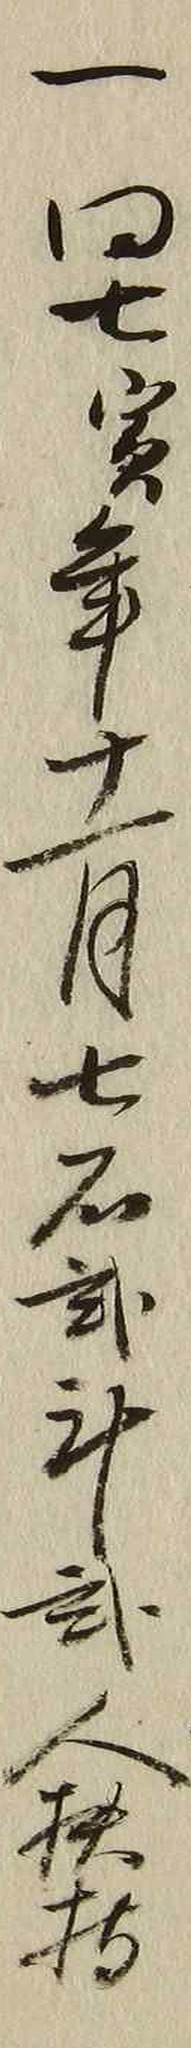一同七寅年十一月七石弐斗弐人扶持
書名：諸士系譜　巻之352　す之部2
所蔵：会津若松市立会津図書館
